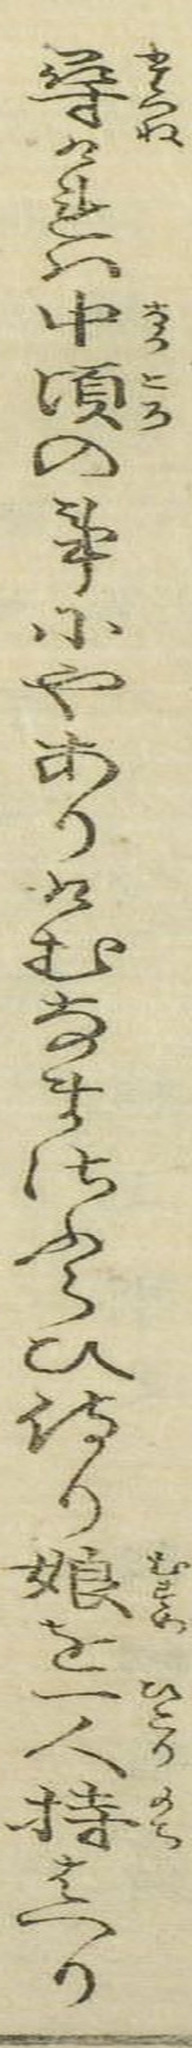尋けれは中頃の事にやありけむなまさふらひ侍り娘を一人持はへり
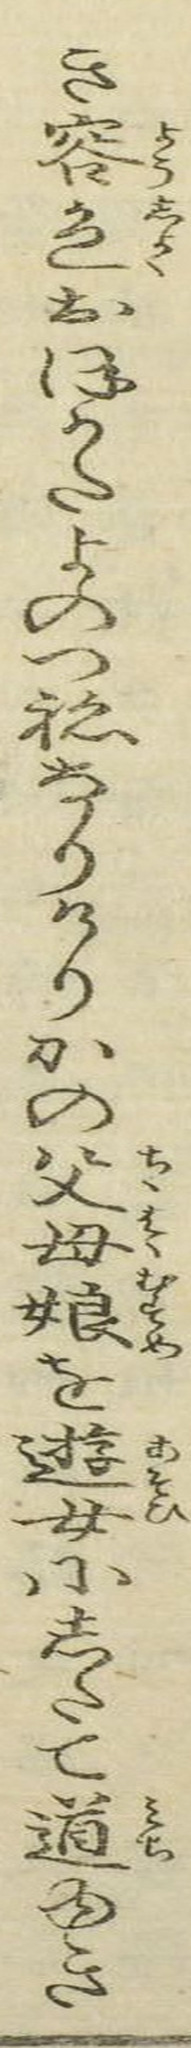き容色おほかたよのつねなりけりかの父母娘を遊女にしたて道ゆき
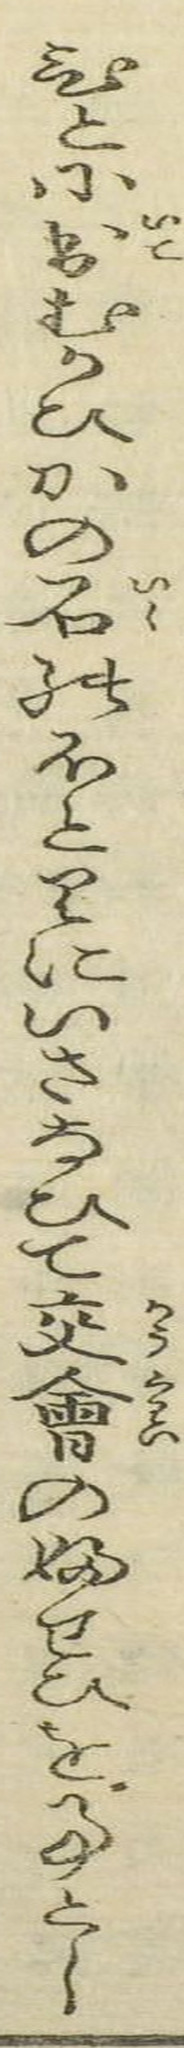ひとに出むかひかの石のほとりにいさなひて交会のふせひを事とし
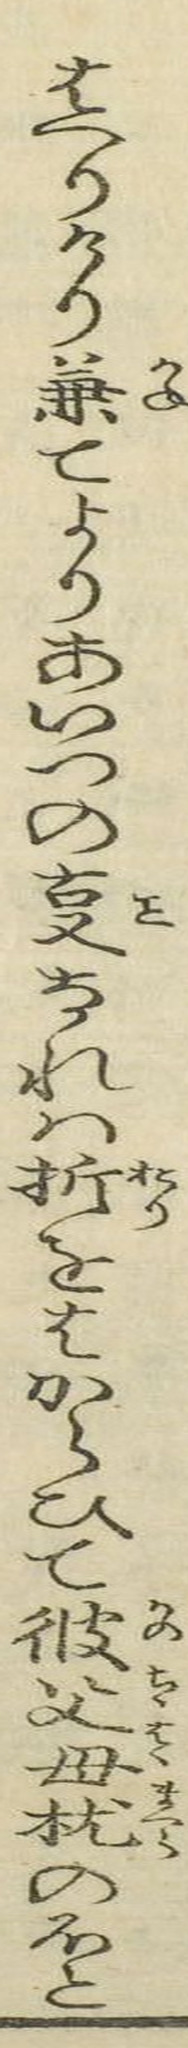はへりけり兼てよりあいつの事なれは折をはからひて彼父母枕のほと
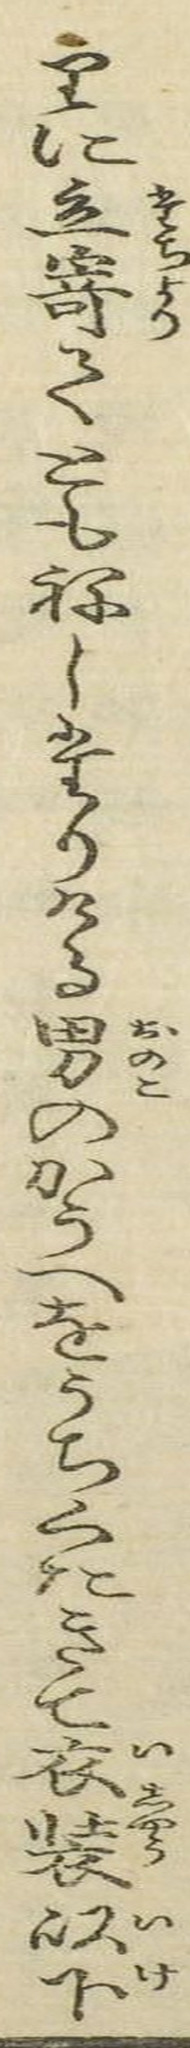りに立寄てともねしたりける男のかうへをうちくたきて衣装以下
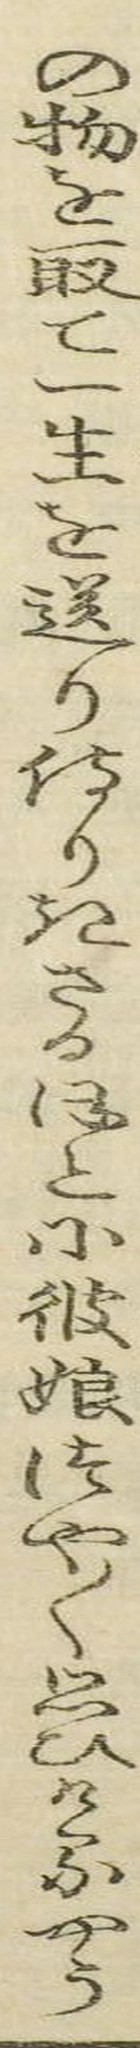の物を取て一生を送り侍りきさるほとに彼娘つや〳〵思ひけるやう
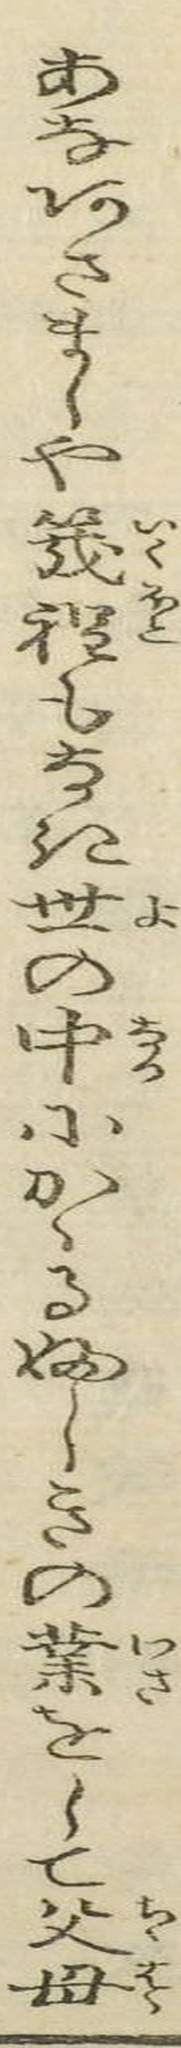あなあさましや幾程もなき世の中にかゝるふしきの業をして父母
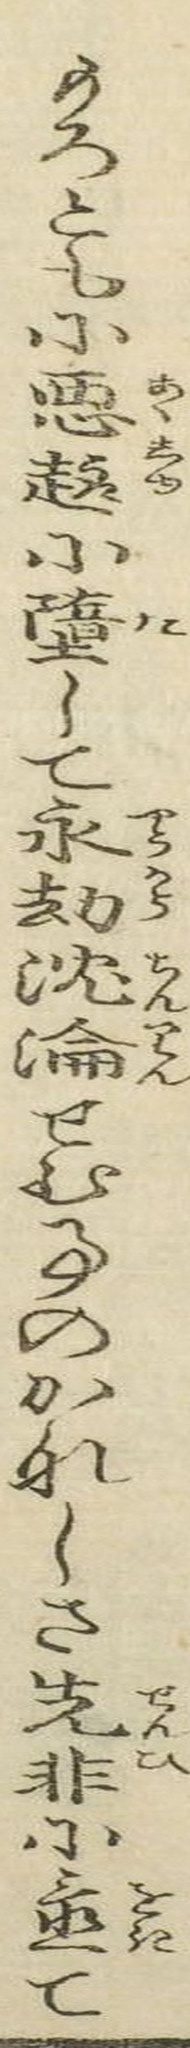もろともに悪趣に堕して永劫沈淪せむ事のかなしさ先非に置て
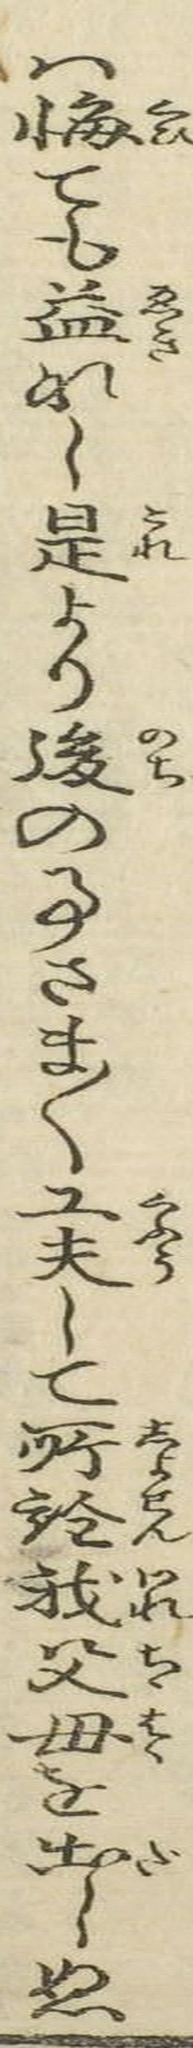は悔ても益なし是より後の事さま〳〵工夫して所詮我父母を出しぬ
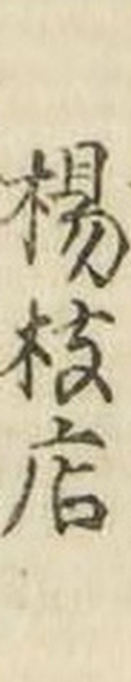楊枝店
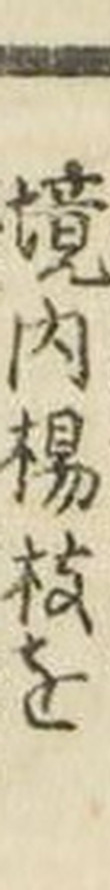境内楊枝を
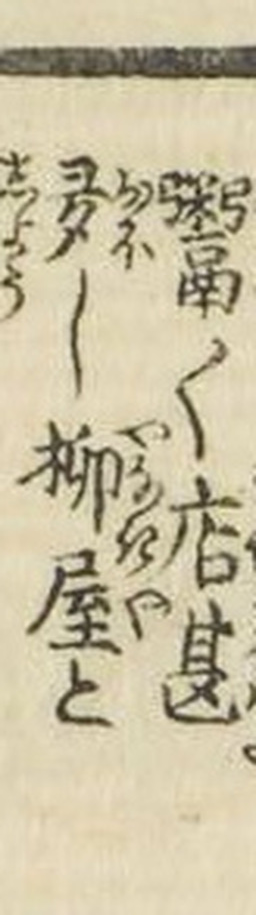多し柳屋と
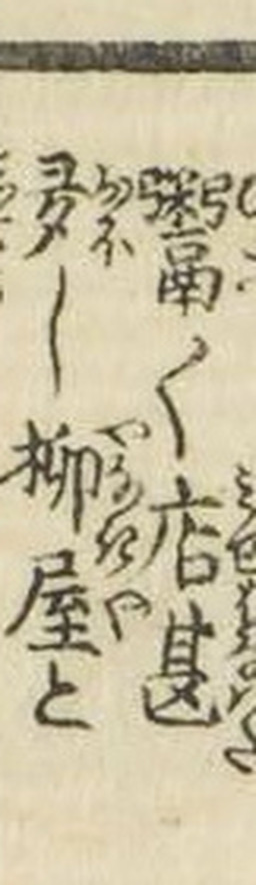多し柳屋と
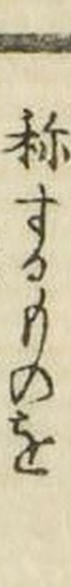称するものを
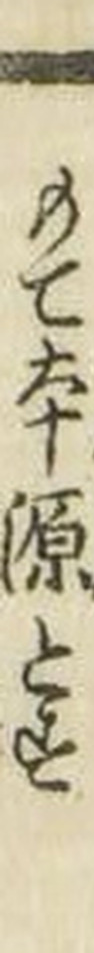もて本源とす
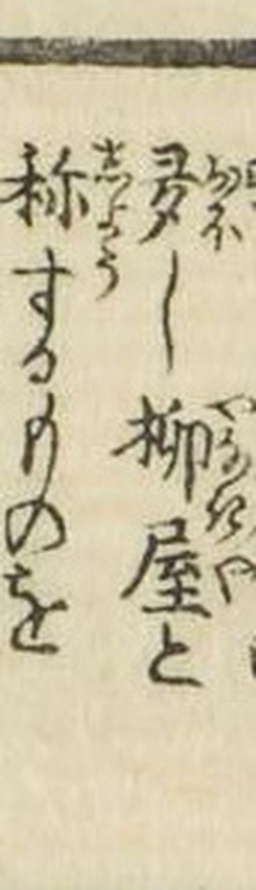称するものを
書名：江戸名所図会 20巻 巻之16
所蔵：東京学芸大学教育コンテンツアーカイブ
